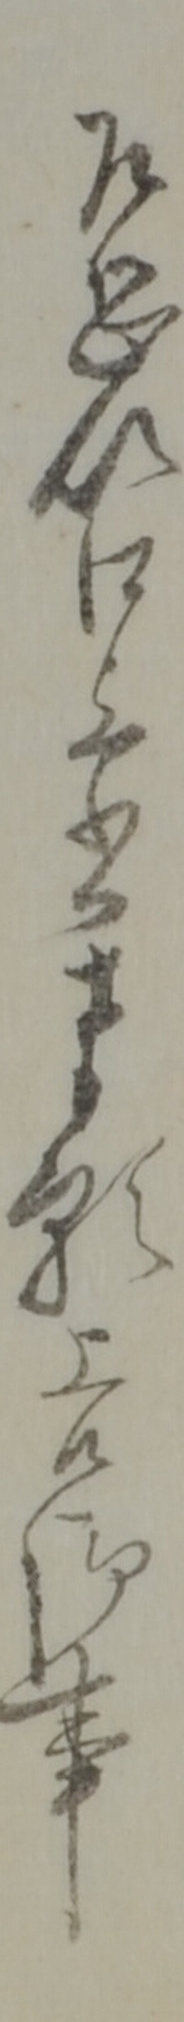乍恐以口上書奉願上候御事
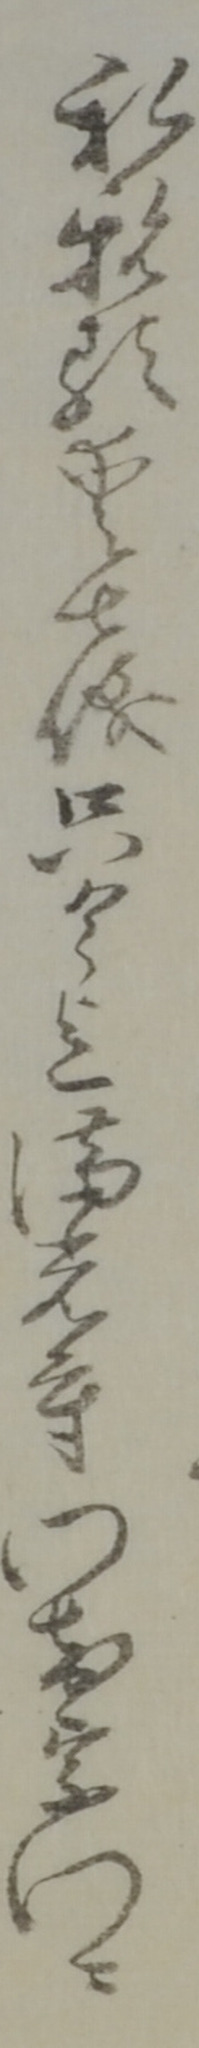私親類愛七儀只今迄満光寺門前宗門ニ
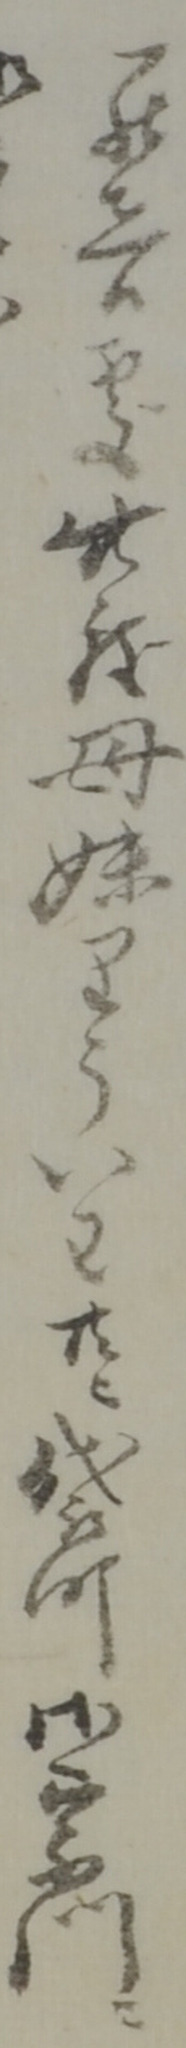罷在候処此度母妹りういわ共々袋町御宗門ニ
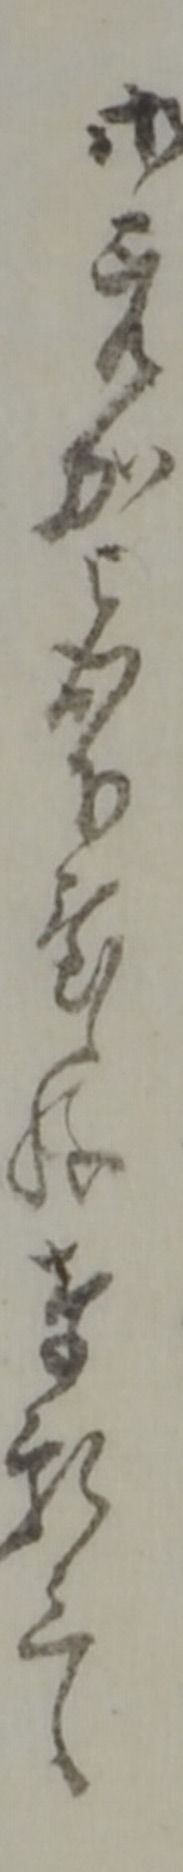御差加被成下置候様奉願上候
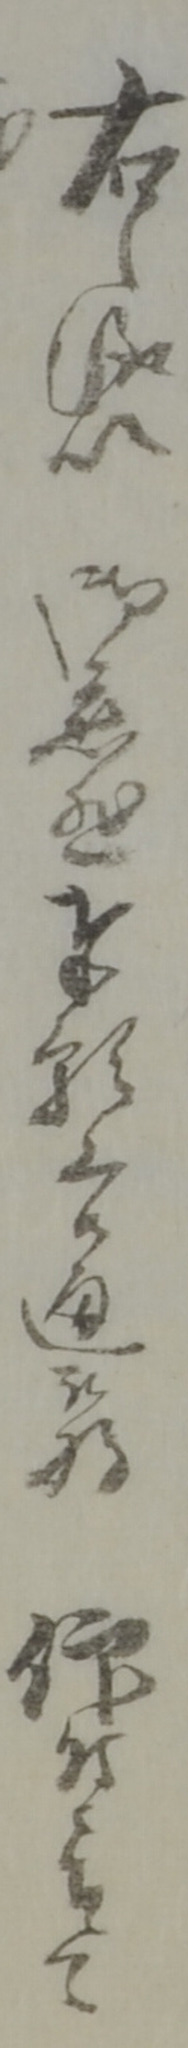右之趣以御慈悲奉願上候通被為仰付被下候ハヽ
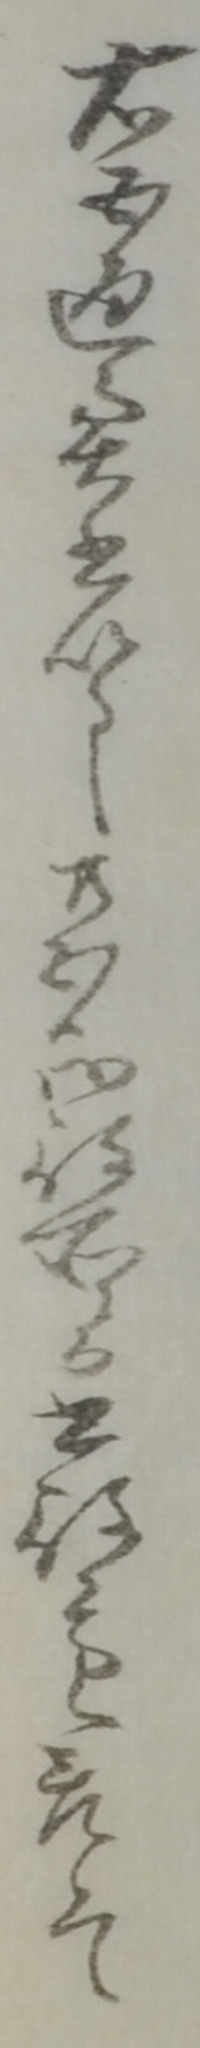右五通奥書いたし廿五日御役所ニ而書役方へ差上候

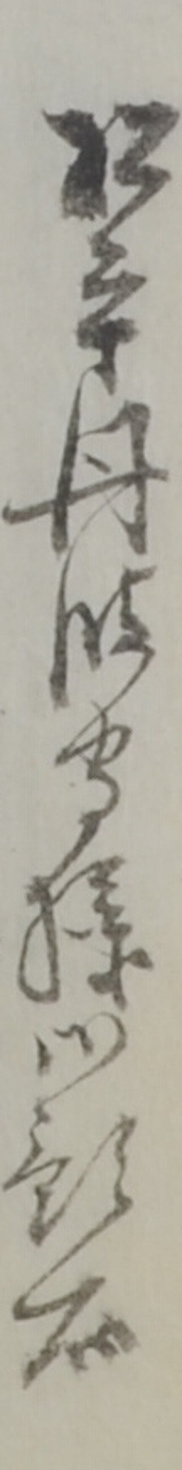松平丹波守様御領所
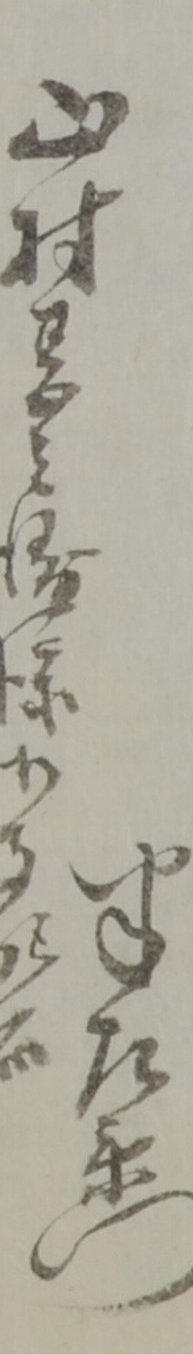山村甚兵衛様御支配所
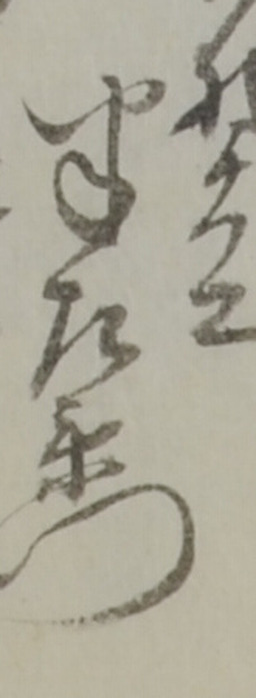半左衛門
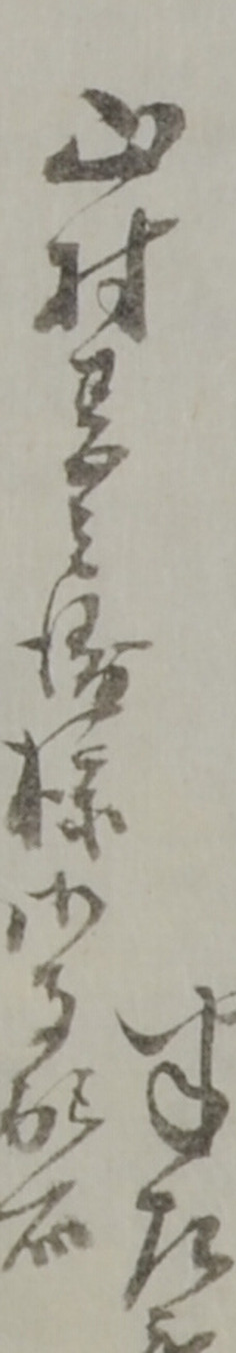山村甚兵衛様御支配所
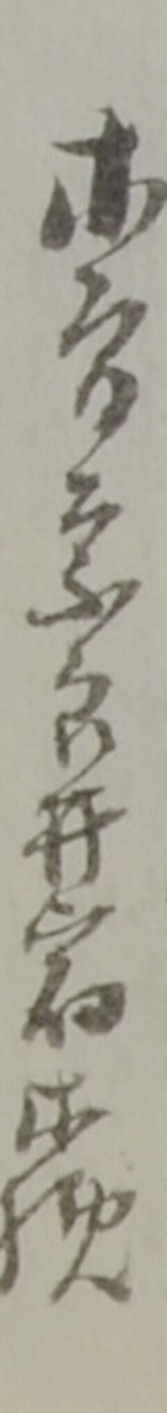木曾奈良井宿木挽
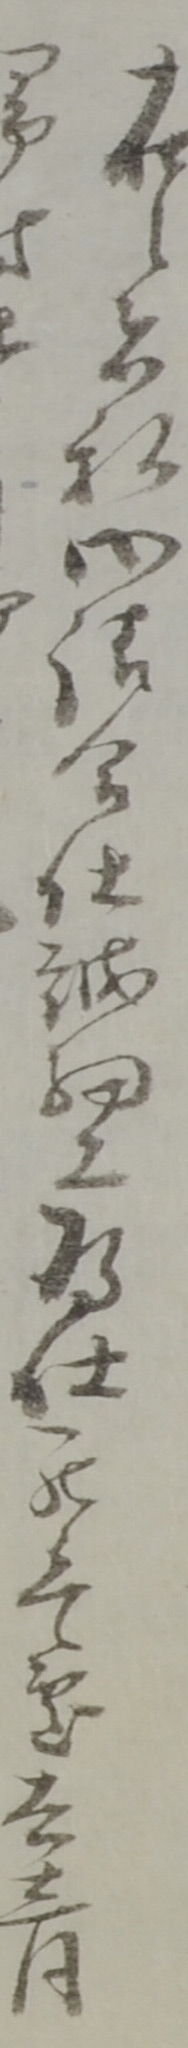右之者私御請合仕越細工為仕罷在候処去十二月
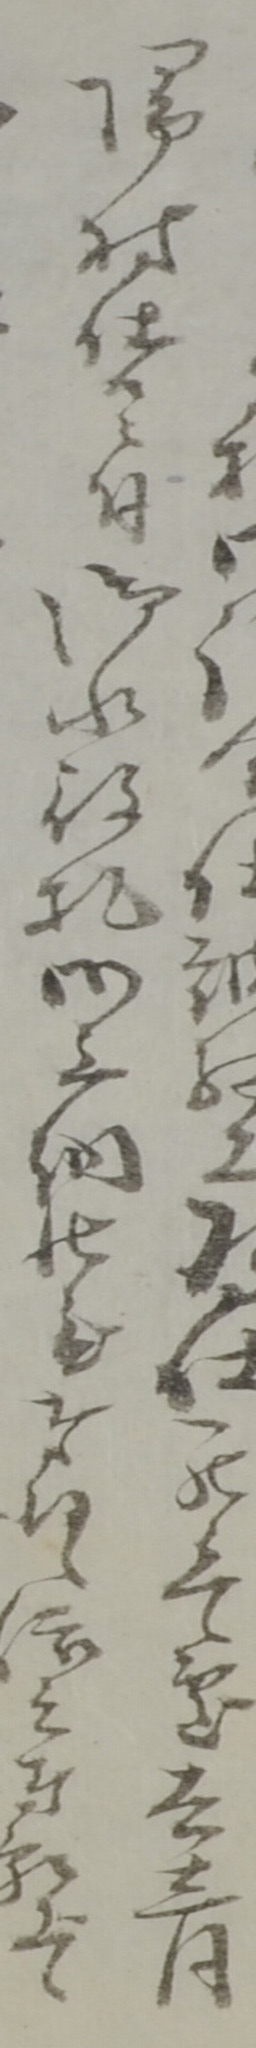帰村仕候ニ付御水役札御上納仕度奉存候依之奉願上候
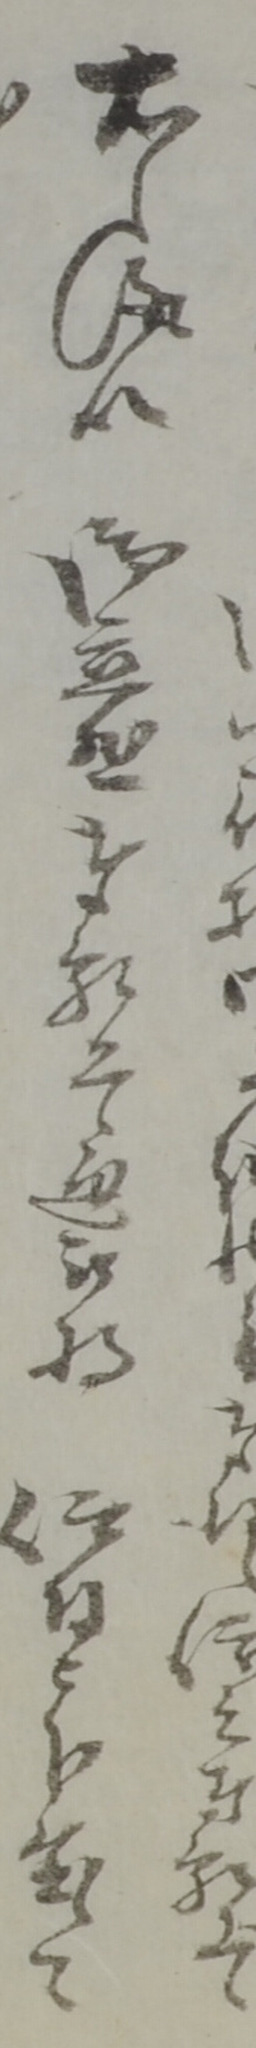右之趣以御慈悲奉願上候通被為仰付被下置候ハヽ
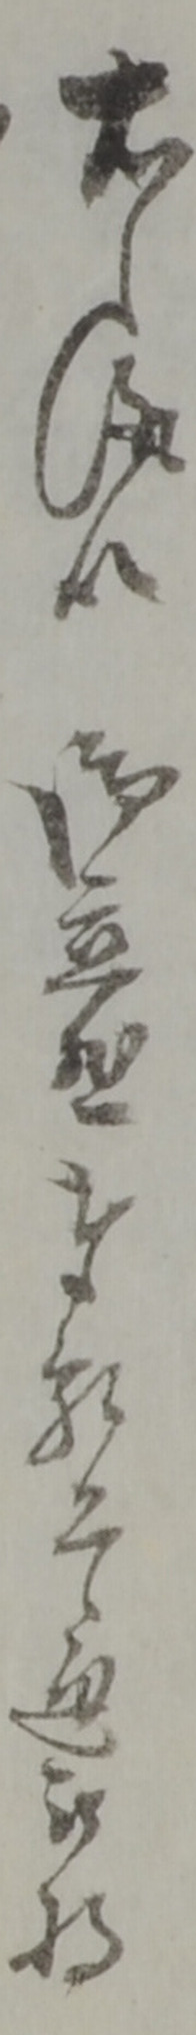右之趣以御慈悲奉願上候通被為仰付
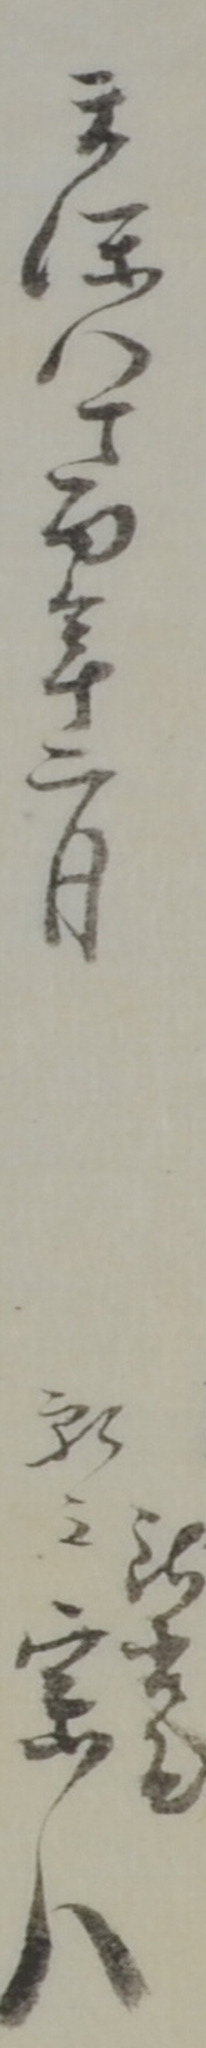天保八丁酉年二月願主勘四郎
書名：諸願書控帳
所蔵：伊那市立高遠町図書館・合同会社AMANE
